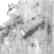利（利）
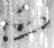㠯（以）
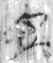見
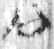公
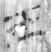王
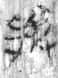與
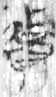貴
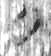人
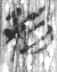利（利）
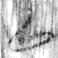㠯（以）
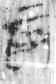取
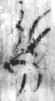貨
